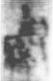顯（韅）
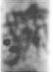鞅
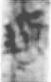○（鞍）
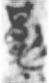○（貂）
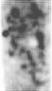○（貘）
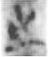之
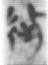紫
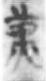黃
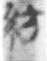紡
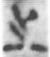之
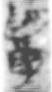○（緅）
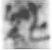紳（靷）
